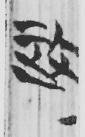政
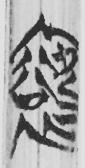{衣欲}（欲）
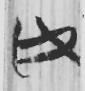女
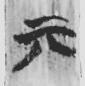亓
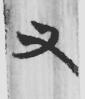又
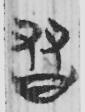{友日}
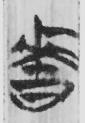{来日}
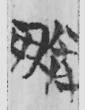朕
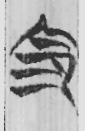命
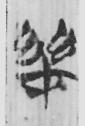𪪋（哉）
